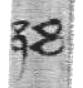郘
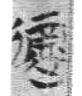逯
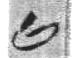㠯
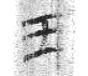王
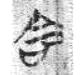命
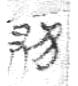賜
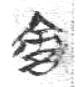舒
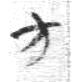方
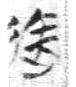御
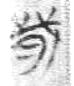歲（歲）
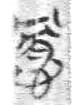愲
